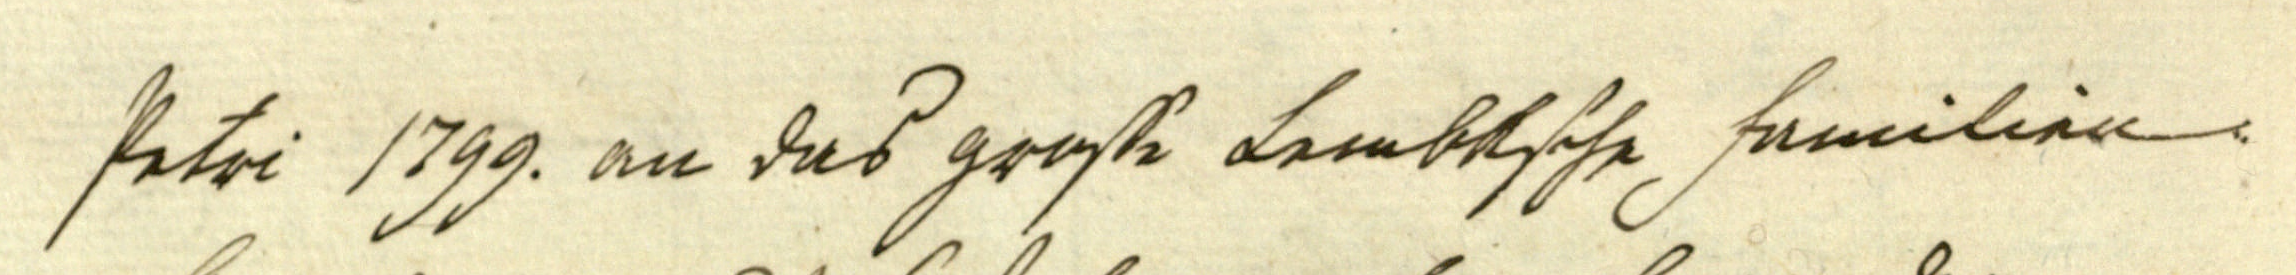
Petri 1799. an das grosse Lembksche Familien
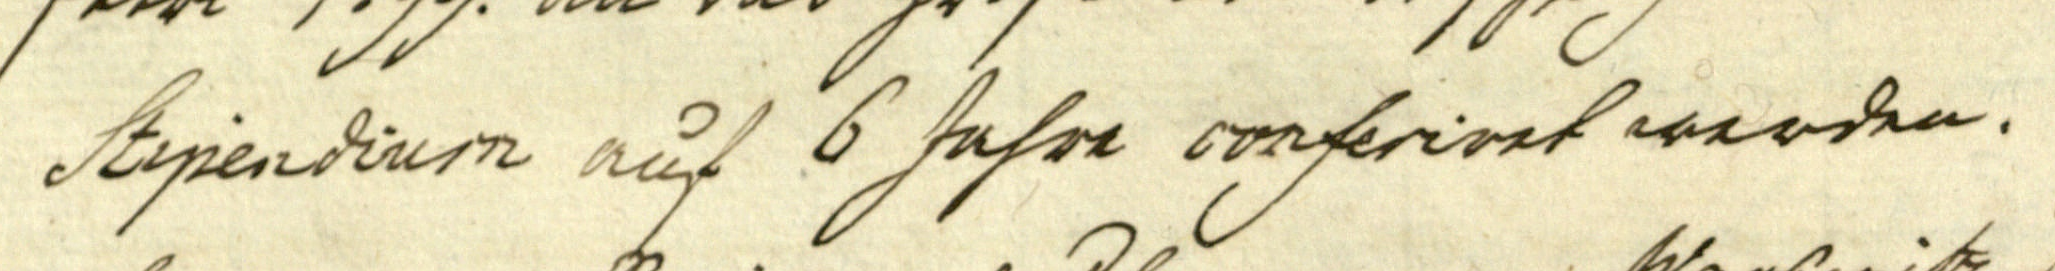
Stipendium auf 6 Jahre conferiret werden.
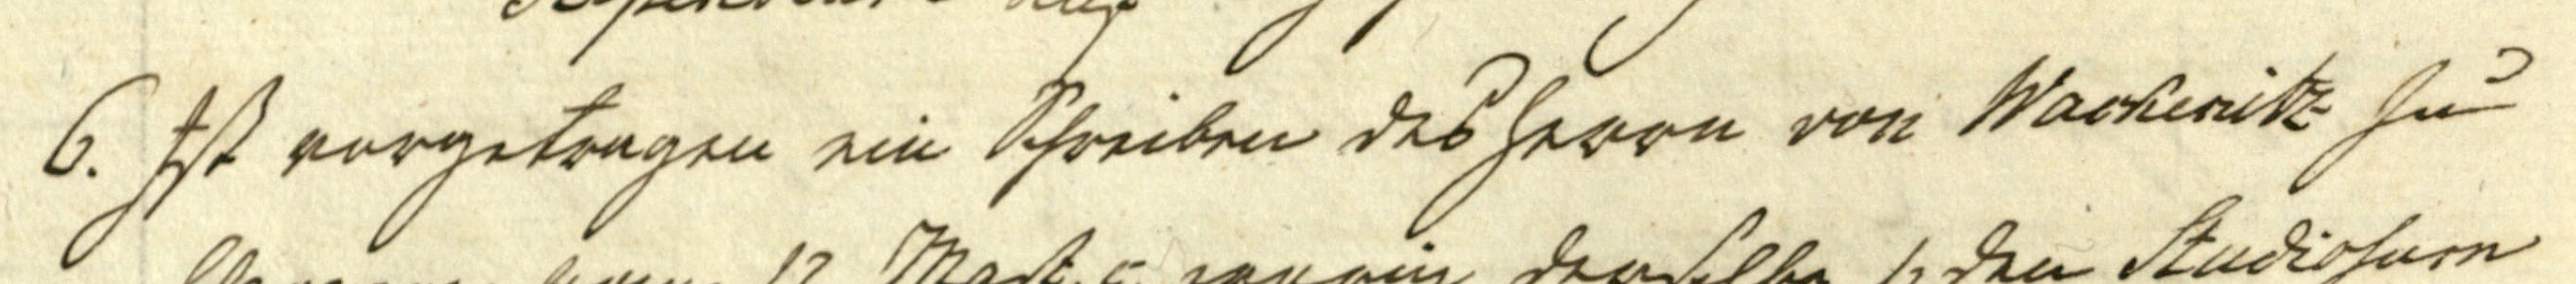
6. Ist vorgetragen ein Schreiben des Herrn von Wackenitz zu
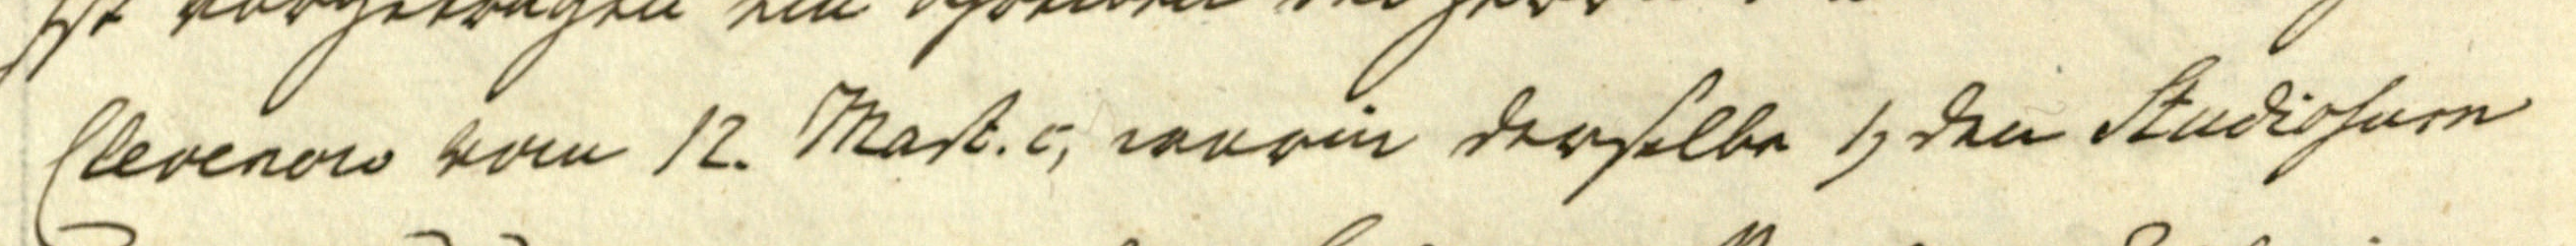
Clevenow vom 12. Mart. c, worin derselbe 1, den Studiosum
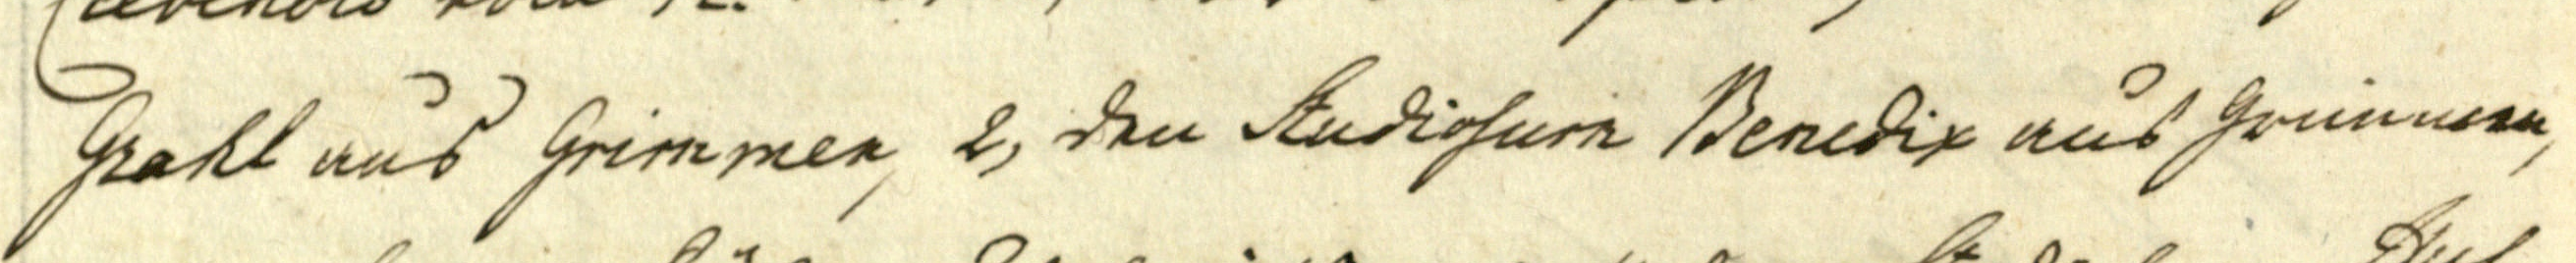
Grahl aus Grimmen, 2, den Studiosum Benedirx aus Grimmen,
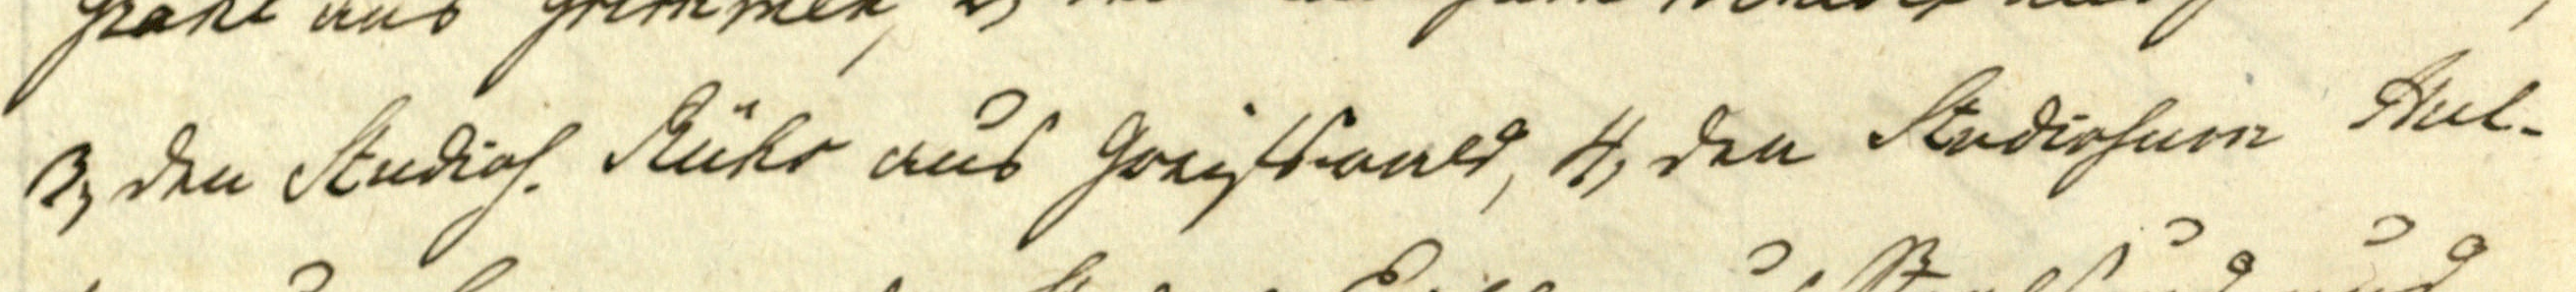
3., den Studios. Rühs aus Greifswald, 4, den Studiosum Hul¬
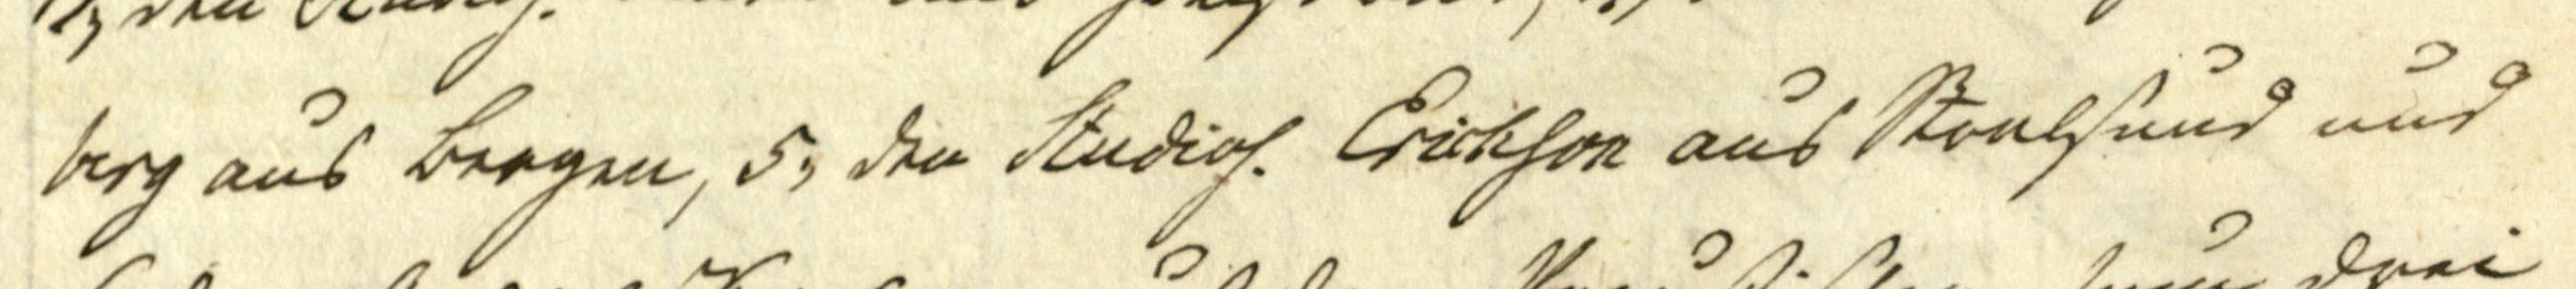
berg aus Bergen, 5. den Studios. Erichson aus Stralsund und
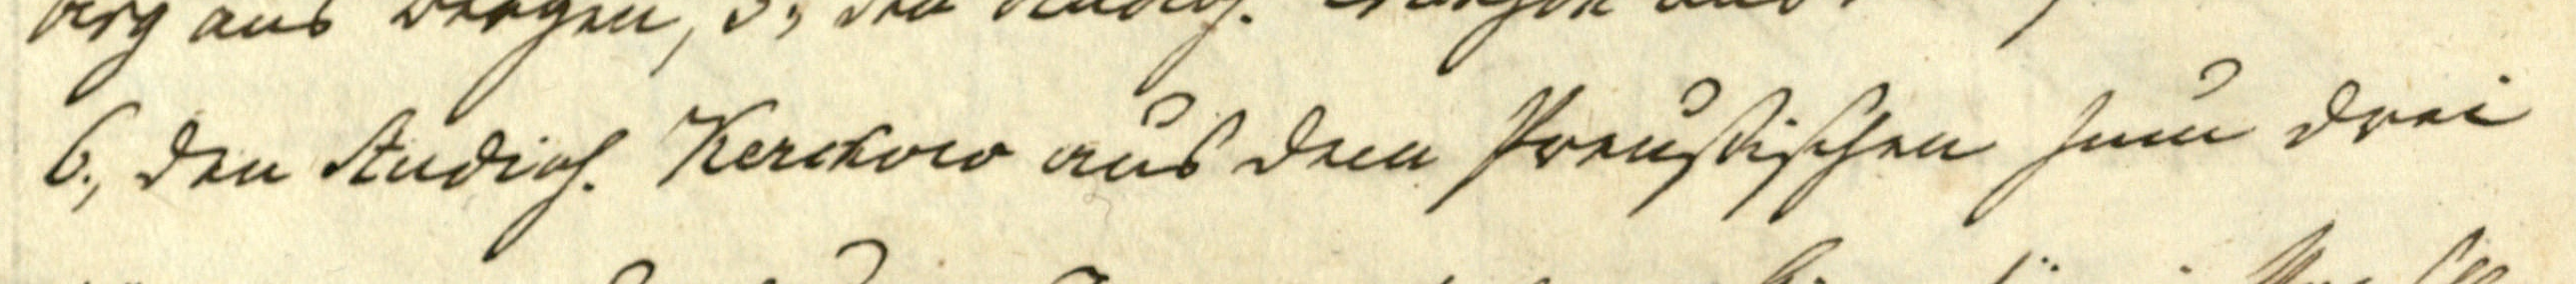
6., den Studios. Kerckow aus dem Preußischen zum drei
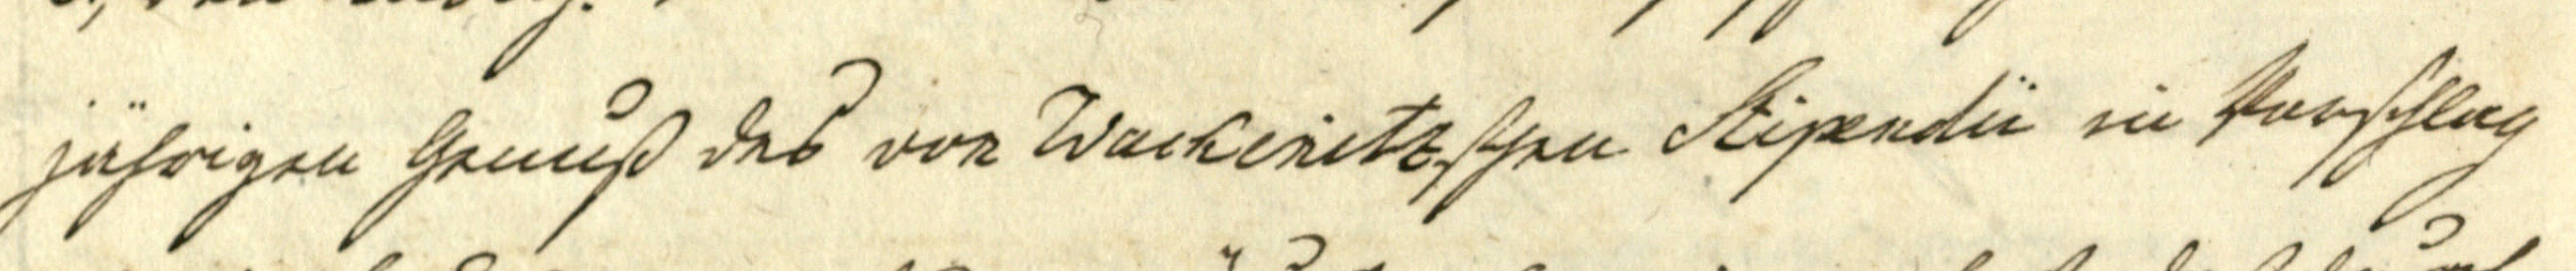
jährigen Genuß des von Wackenitzschen Stipendii in Vorschlag
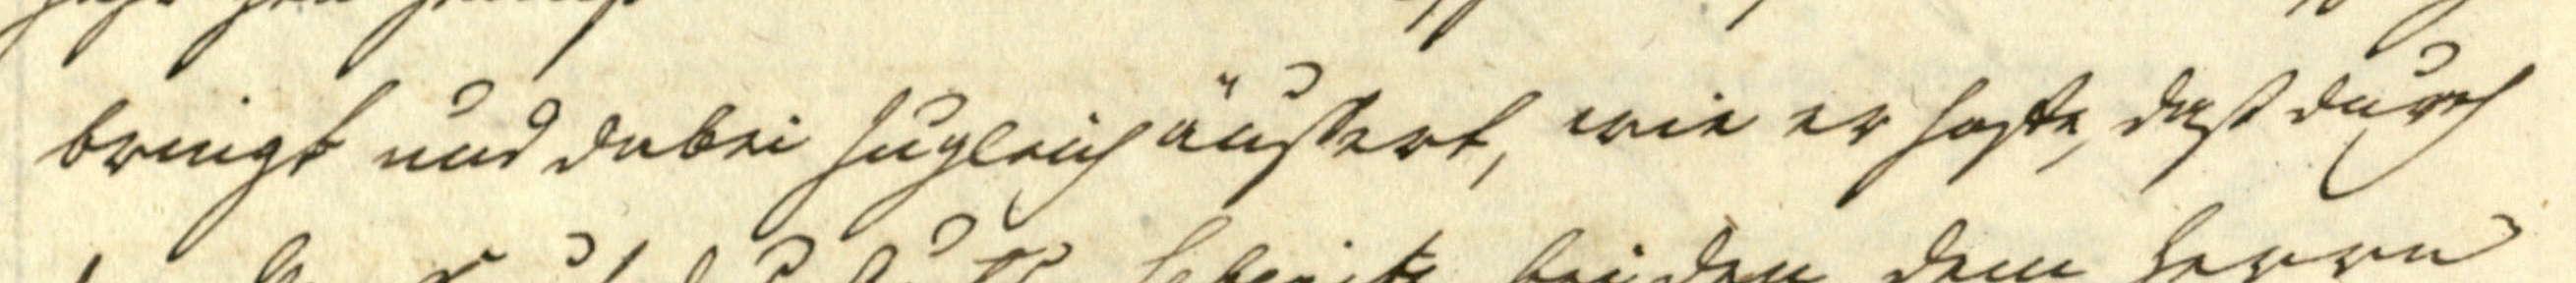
bringt und dabei zugleich äussert, wie er hofe, daß durch
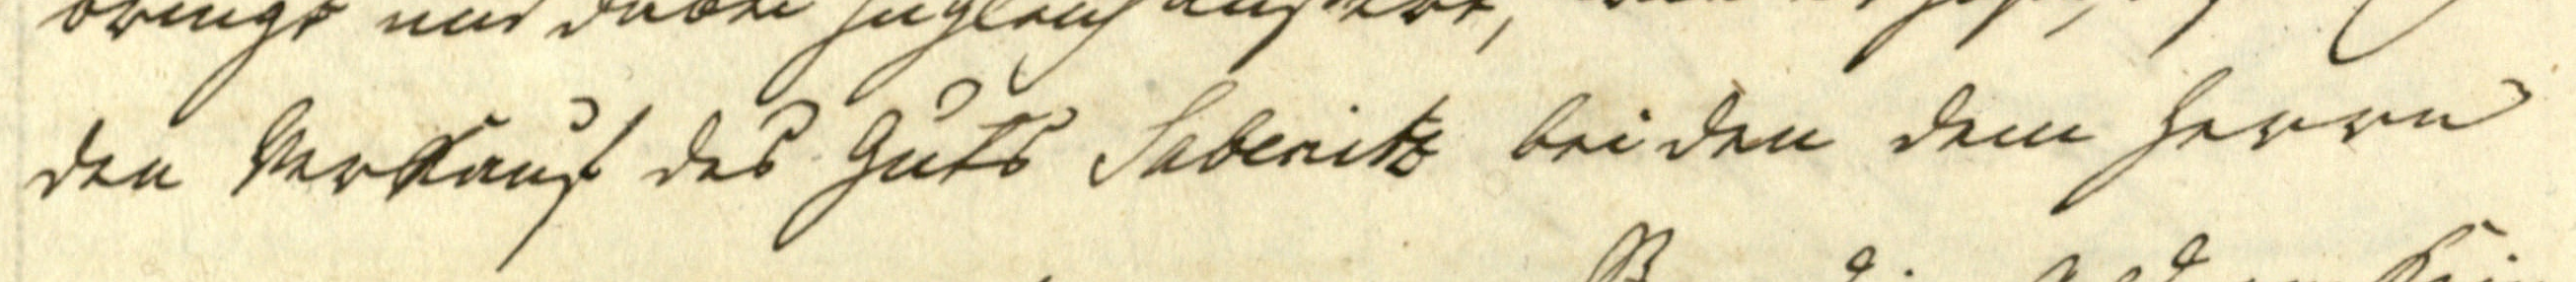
den Verkauf des Guts Sabenitz bei den dem Herrn
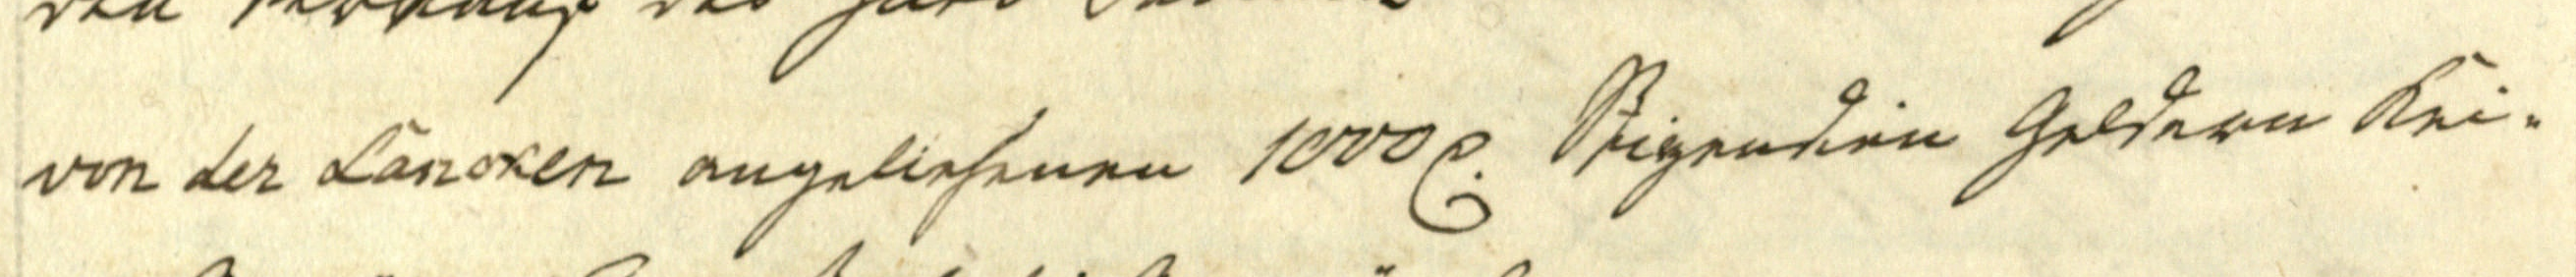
von der Lancken angeliehenen 1000 l. Stipendien Geldern kei¬
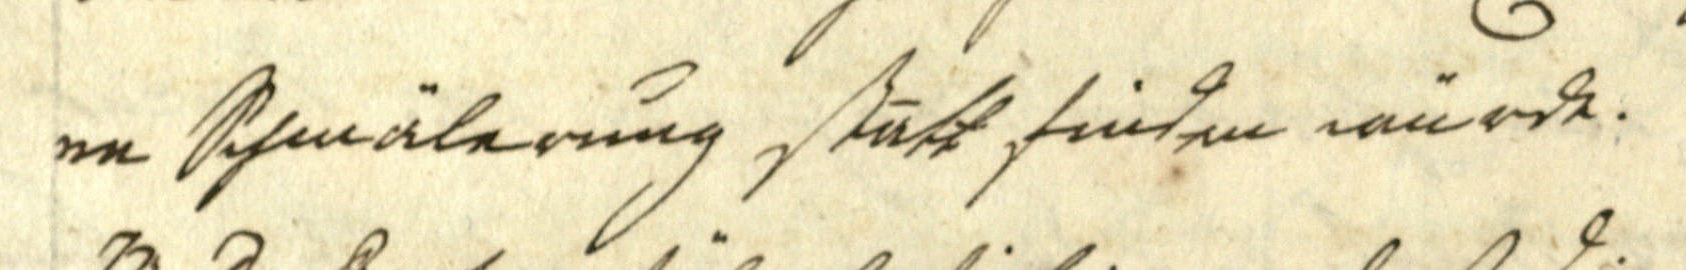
ne Schmälerung statt finden würde.
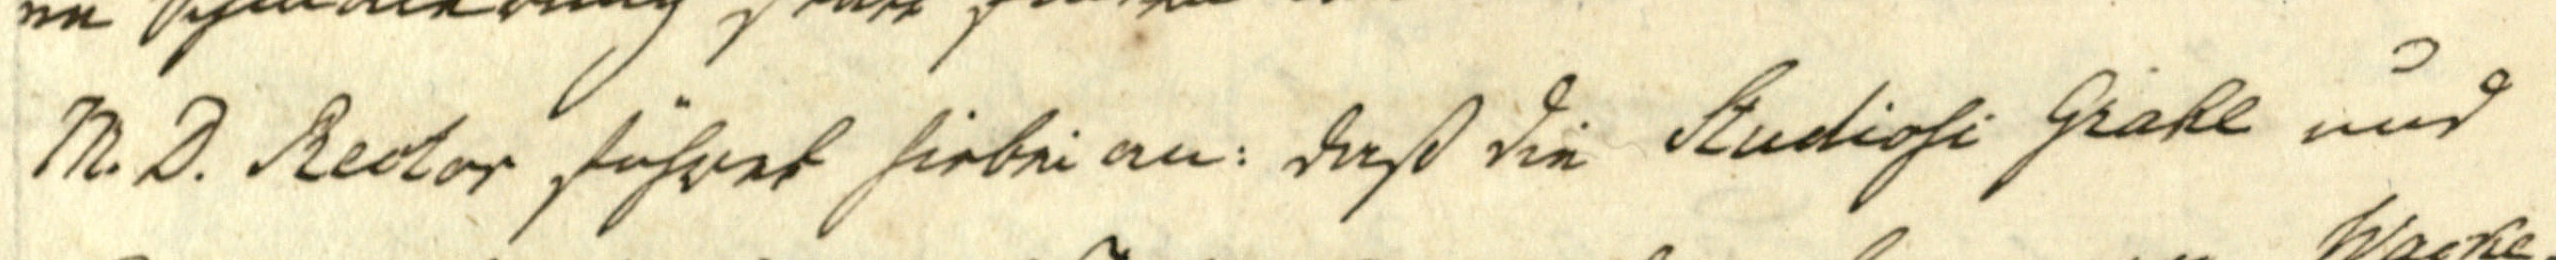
M. D. Rector führet hiebei an: daß die Studiosi Grahl und
